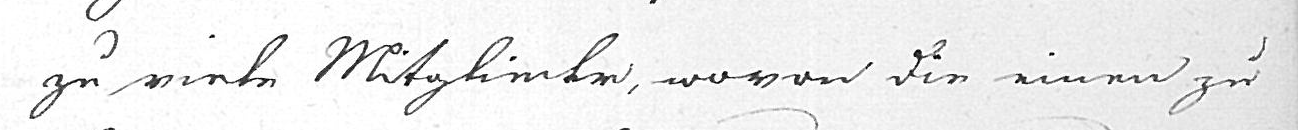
zu viele Mitglieder, wovon die einen zu
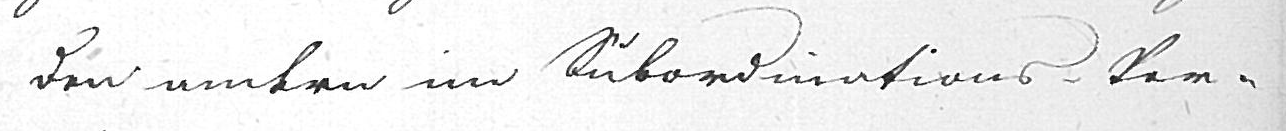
den andern im Subordinations-Ver-
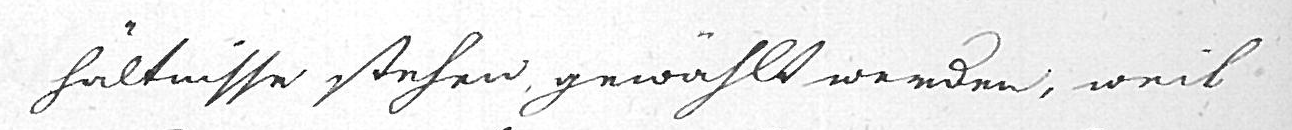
hältnisse stehen, gewählt werden, weil
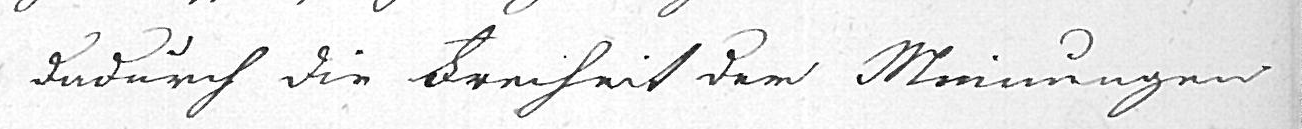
dadurch die Freiheit der Meinungen
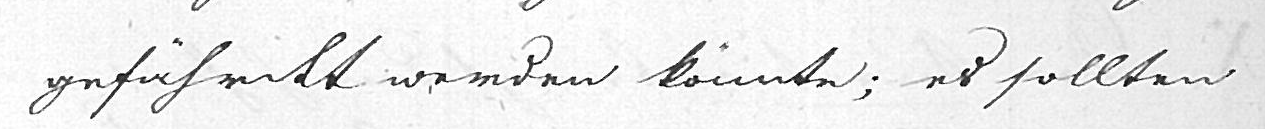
gefährdet werden könnte; es sollten
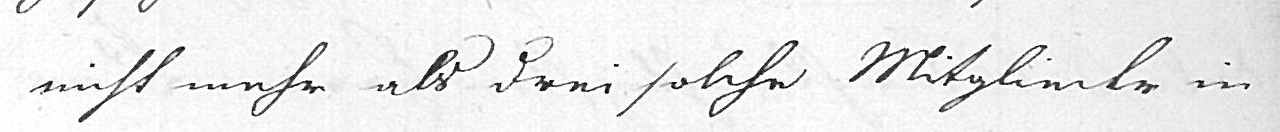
nicht mehr als drei solche Mitglieder in
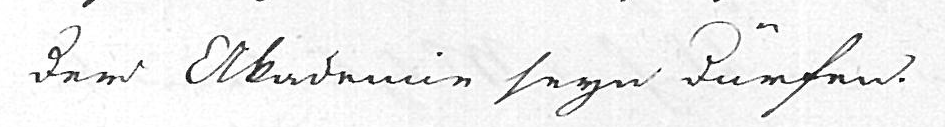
der Akademie seyn dürfen.
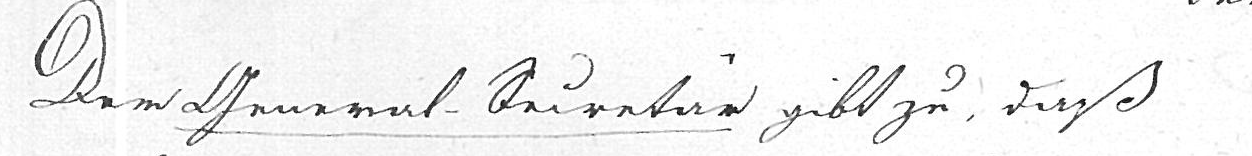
Der General-Secretär gibt zu, daß
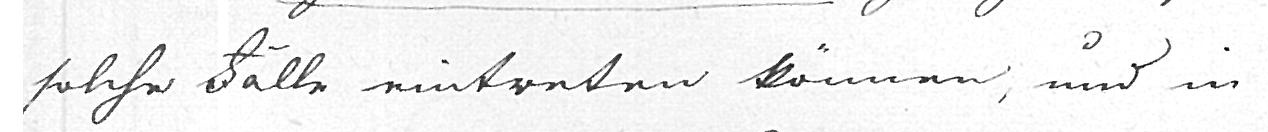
solche Fälle eintreten können, und in
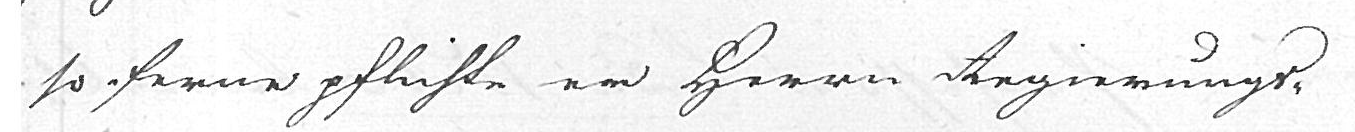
so ferne pflichte er Herrn Regierungs-
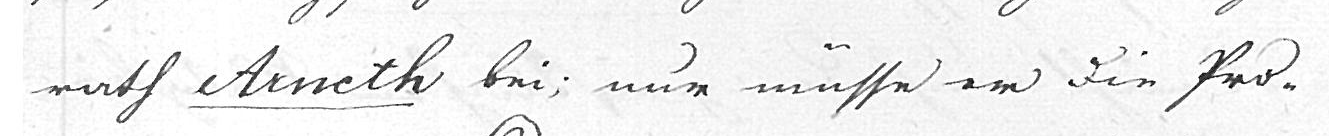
rath Arneth bei; nur müsse er die Pro-
